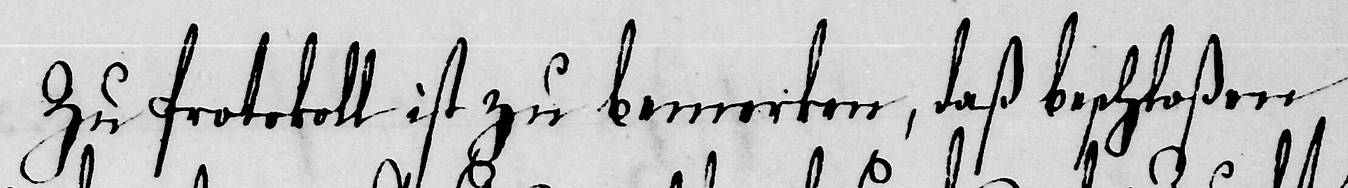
Zu Protokoll ist zu bemerken, daß beschloßen
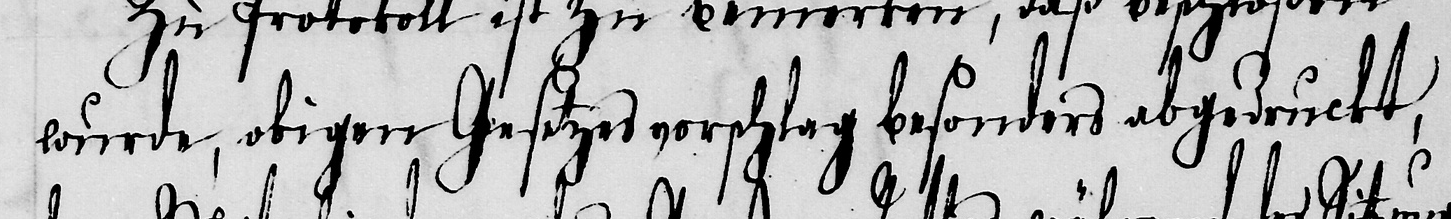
wurde, obigen Gesetzesvorschlag besonders abgedruckt
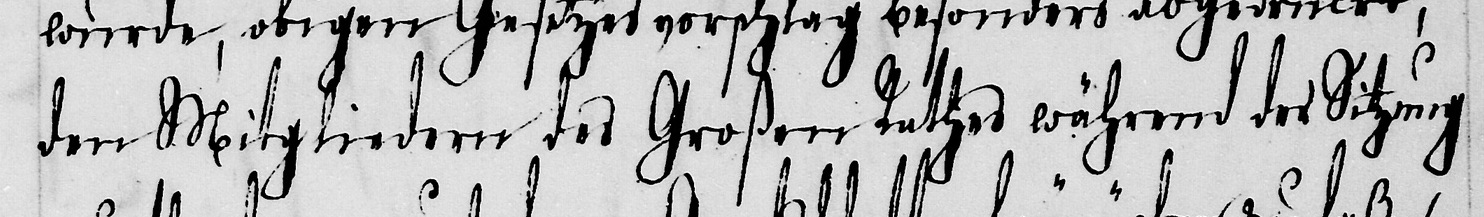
den Mitgliedern des Großen Rathes während der Sitzung
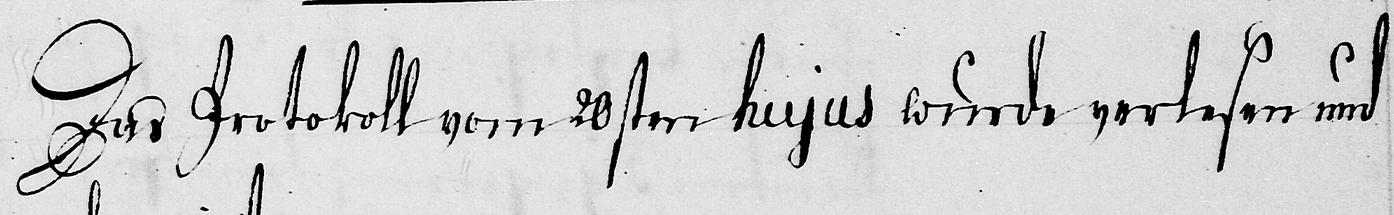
Das Protokoll vom 20sten hujus wurde verlesen und
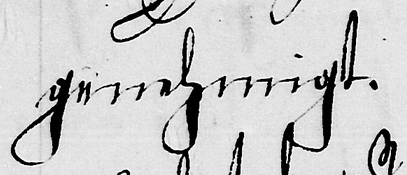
genehmigt.
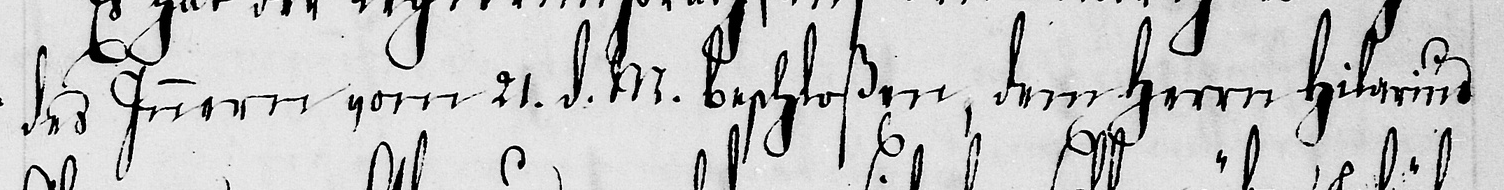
des Innern vom 21. d. M. beschloßen, dem Herrn Hilarius
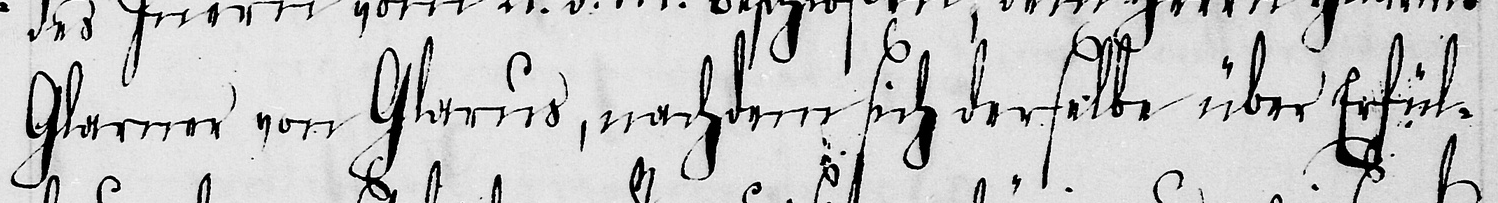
Glarner von Glarus, nachdem sich derselbe über Erfül¬
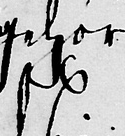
aus¬
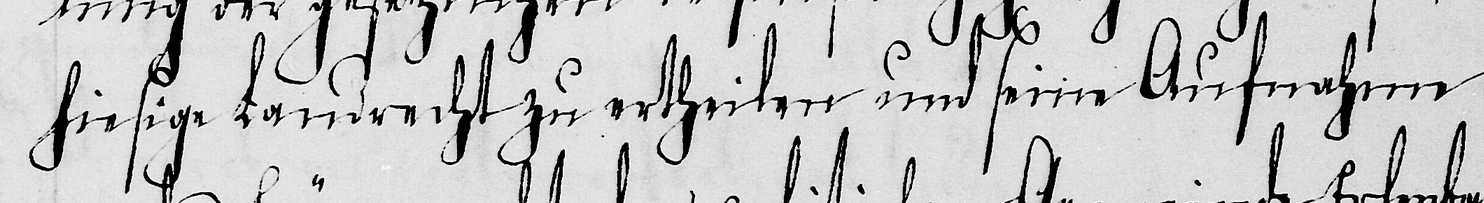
hiesige Landrecht zu ertheilen und seine Aufnahme
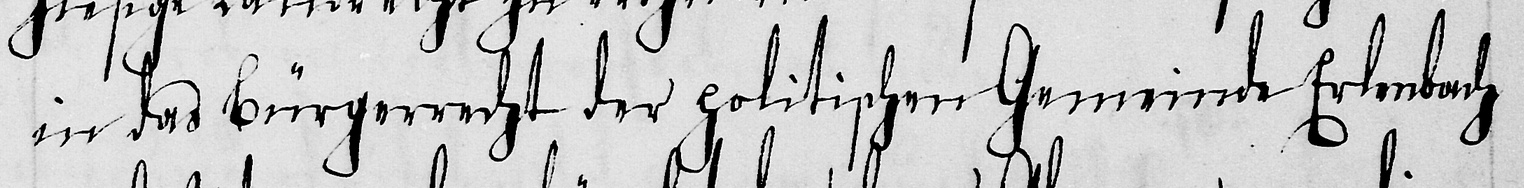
in das Bürgerrecht der politischen Gemeinde Erlenbach
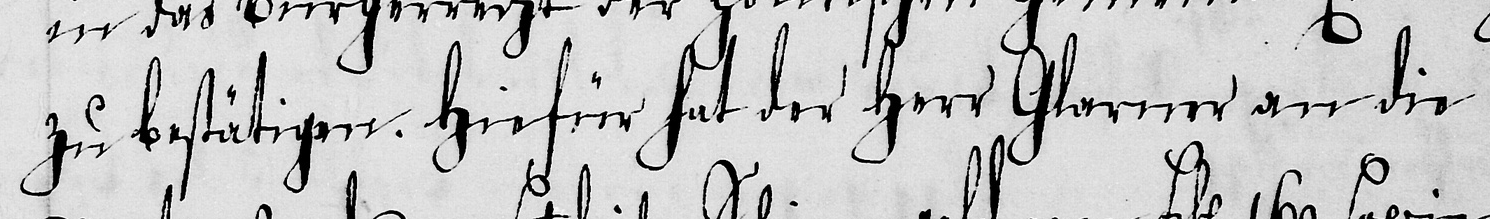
zu bestätigen. Hierfür hat der Herr Glarner an die
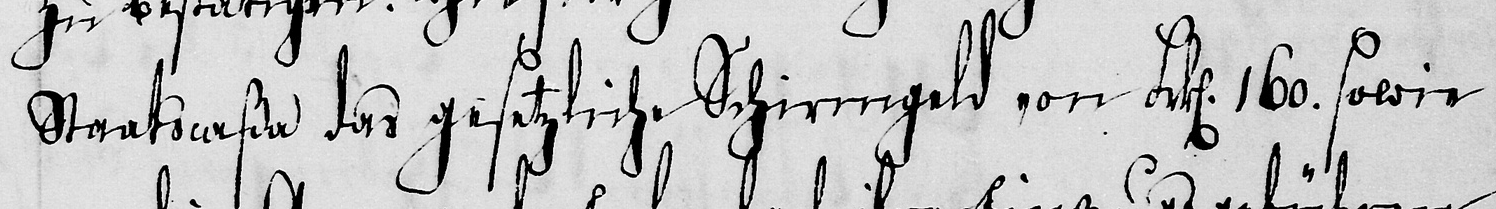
Staatscaßa das gesetzliche Schirmgeld von Frk[en]. 160. sowie
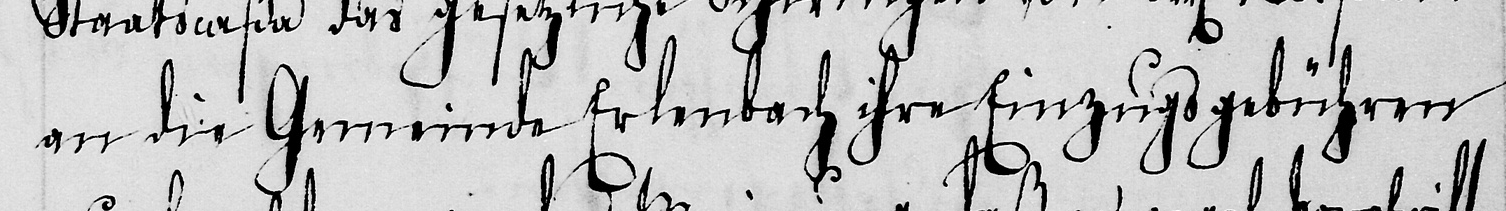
an die Gemeinde Erlenbach ihre Einzugsgebühren
